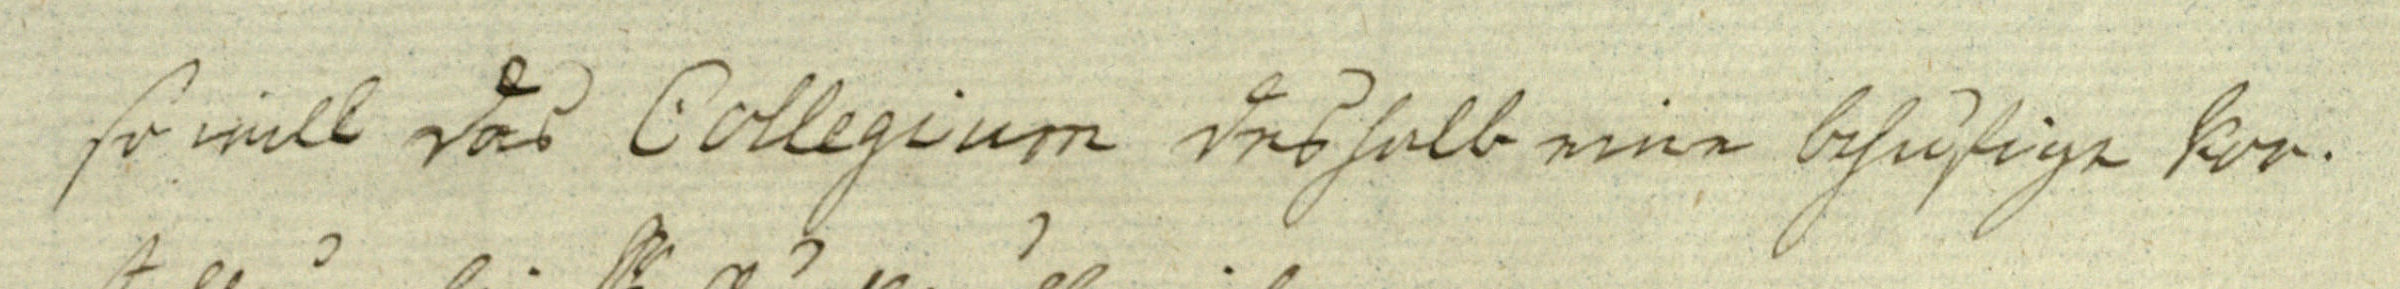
so will das Collegium deshalb eine behufige Vor¬
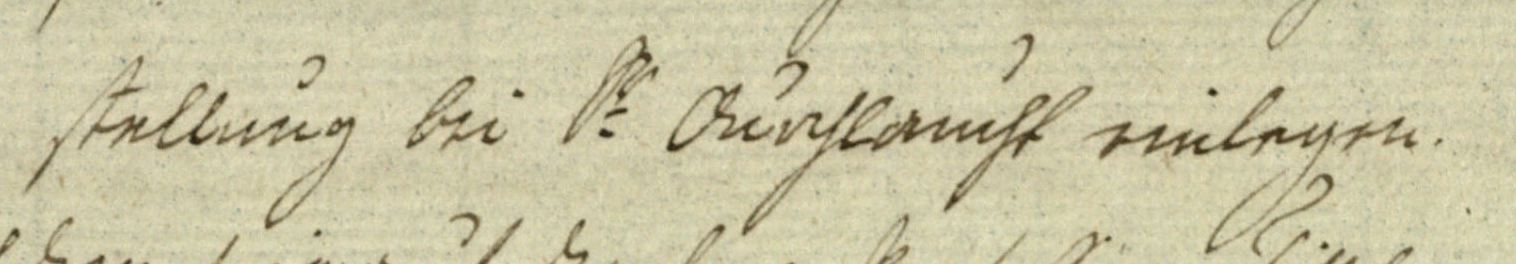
stellung bei Sr Durchlaucht einlegen.
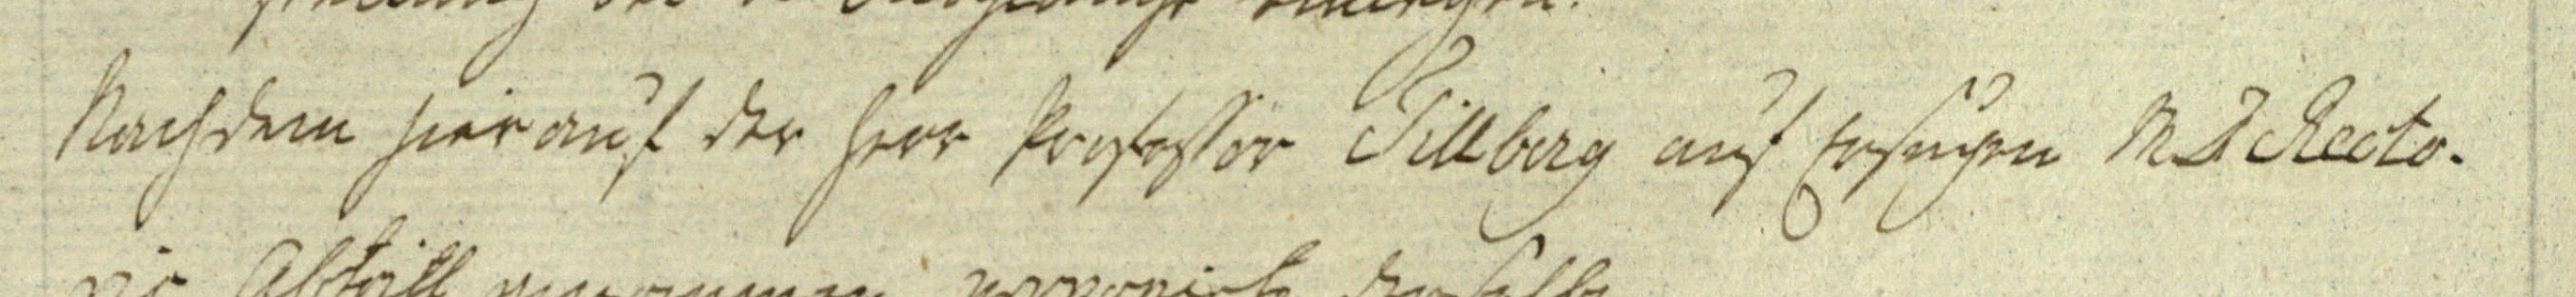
Nachdem hierauf der Herr Professor Tillberg auf Ersuchen M D. Rector¬
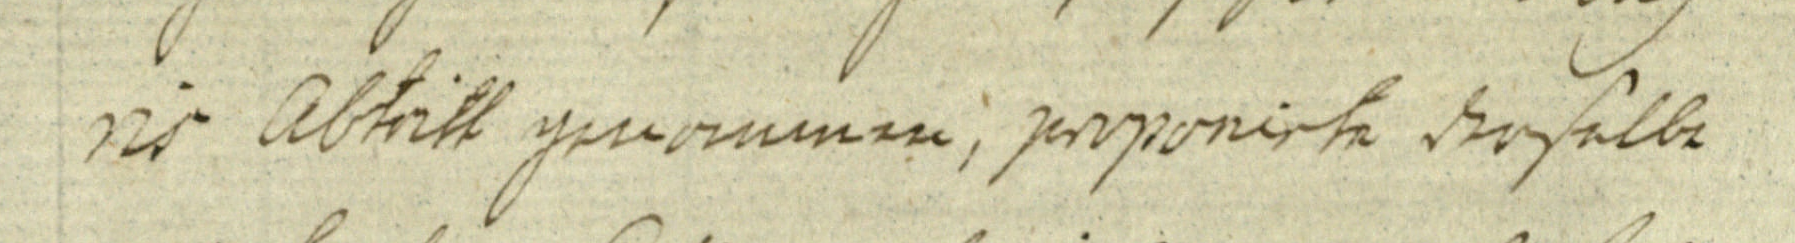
ris Abtritt genommen; proponirte derselbe
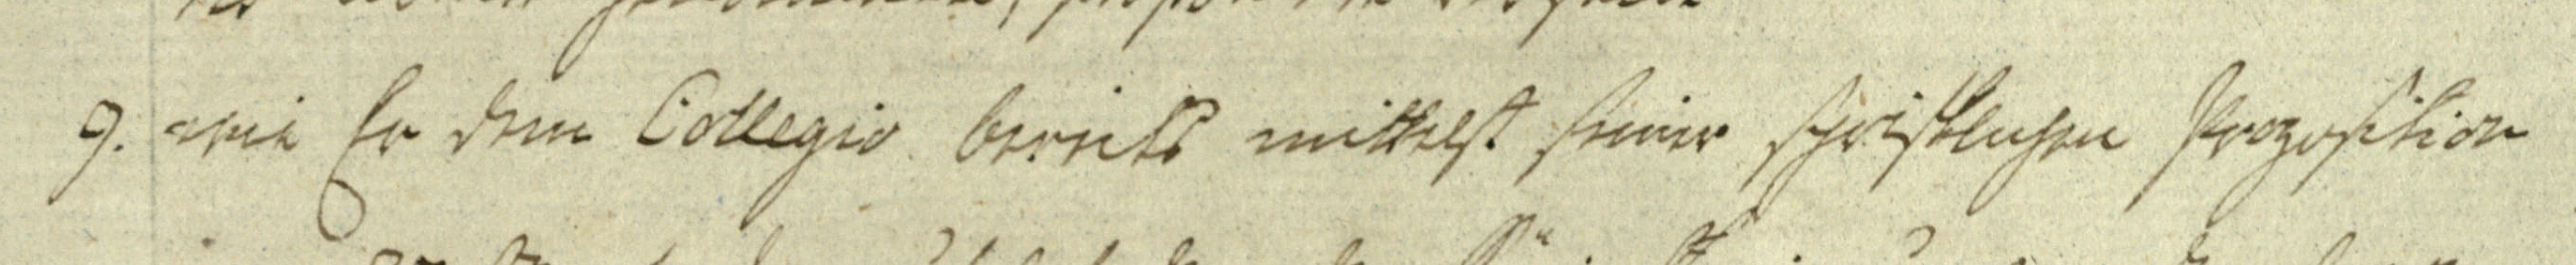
9. wie Er dem Collegio bereits mittelst seiner schriftlichen Proposition
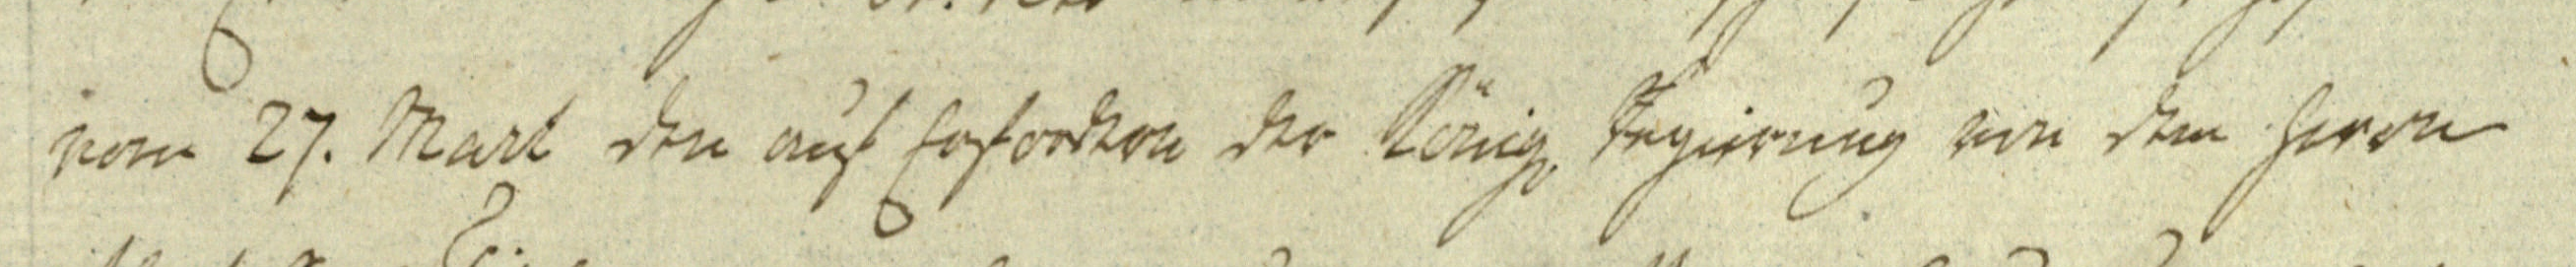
vom 27. Mart den auf Erfordern der Königl. Regierung von dem Herrn
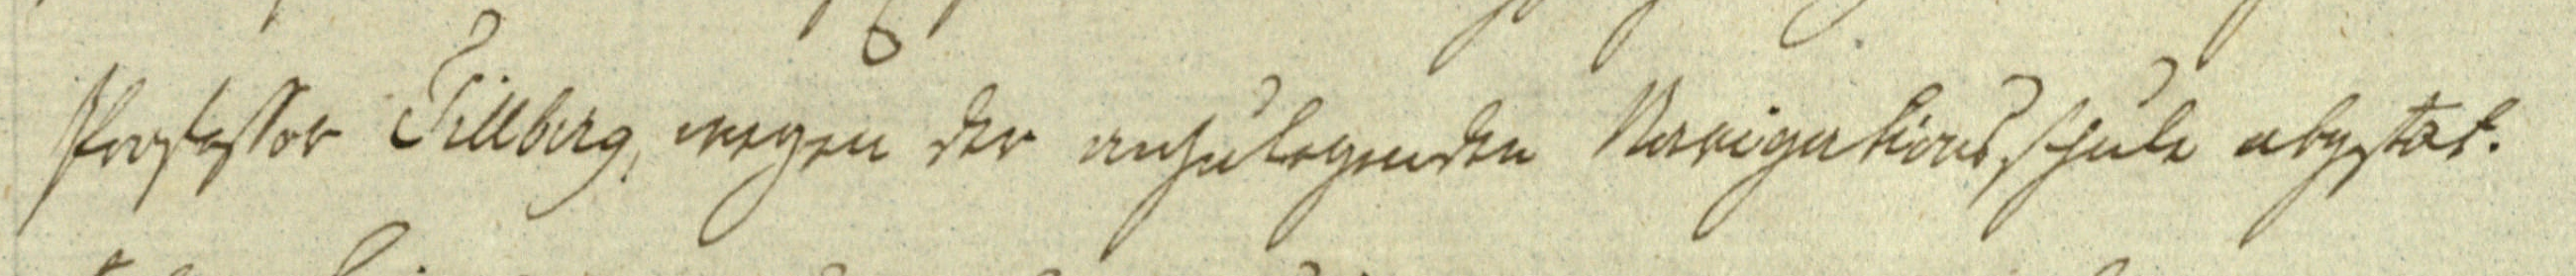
Professor Tillberg, wegen der anzulegenden Navigationsschule abgestat¬
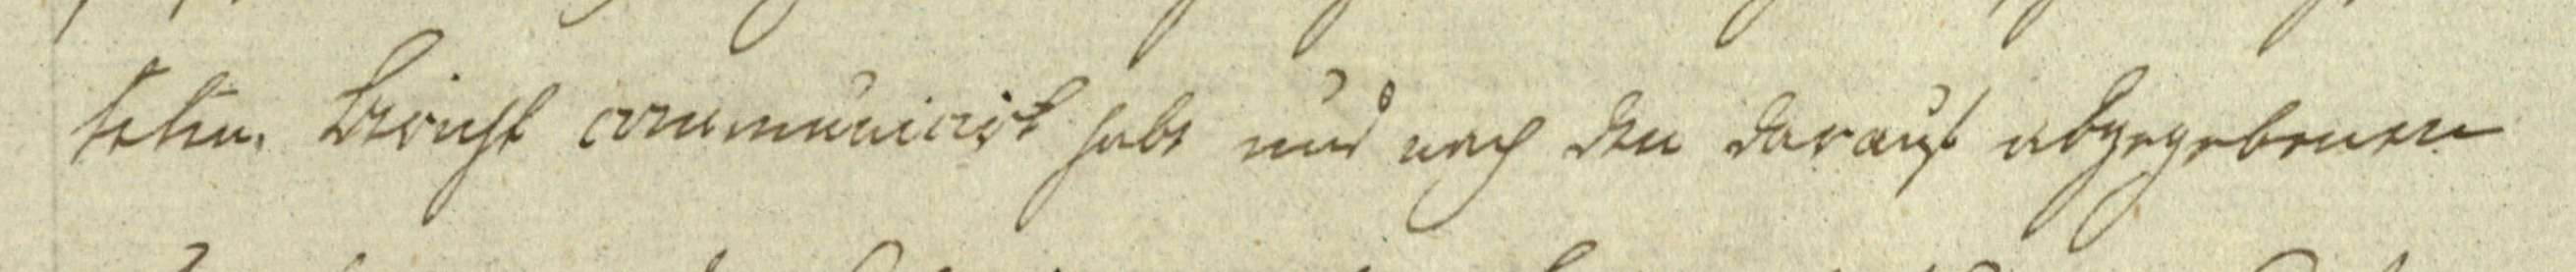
teten Bericht communicirt habe und nach den darauf abgegebenen
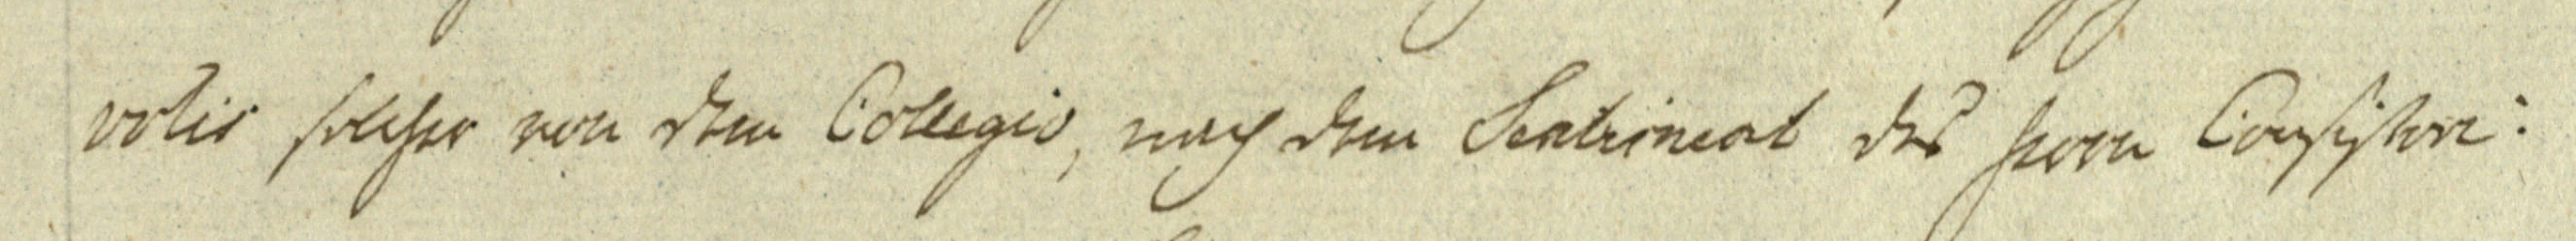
votis solcher von dem Collegio, nach dem Sentiment des Herrn Consistori¬
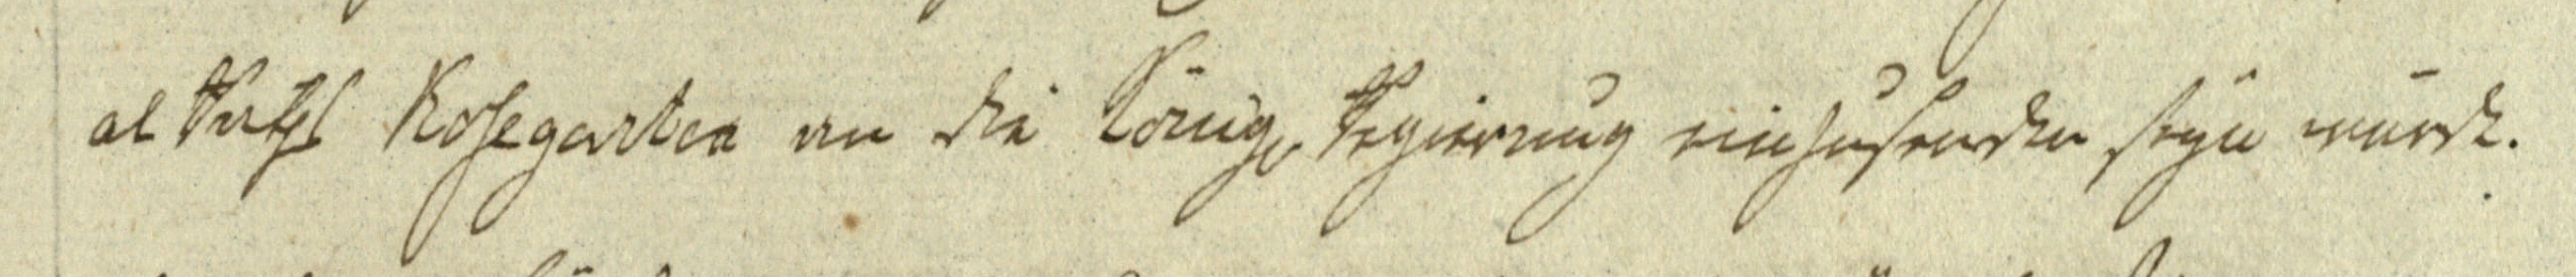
al Raths Kosegarten an die Königl. Regierung einzusenden seÿn würde.
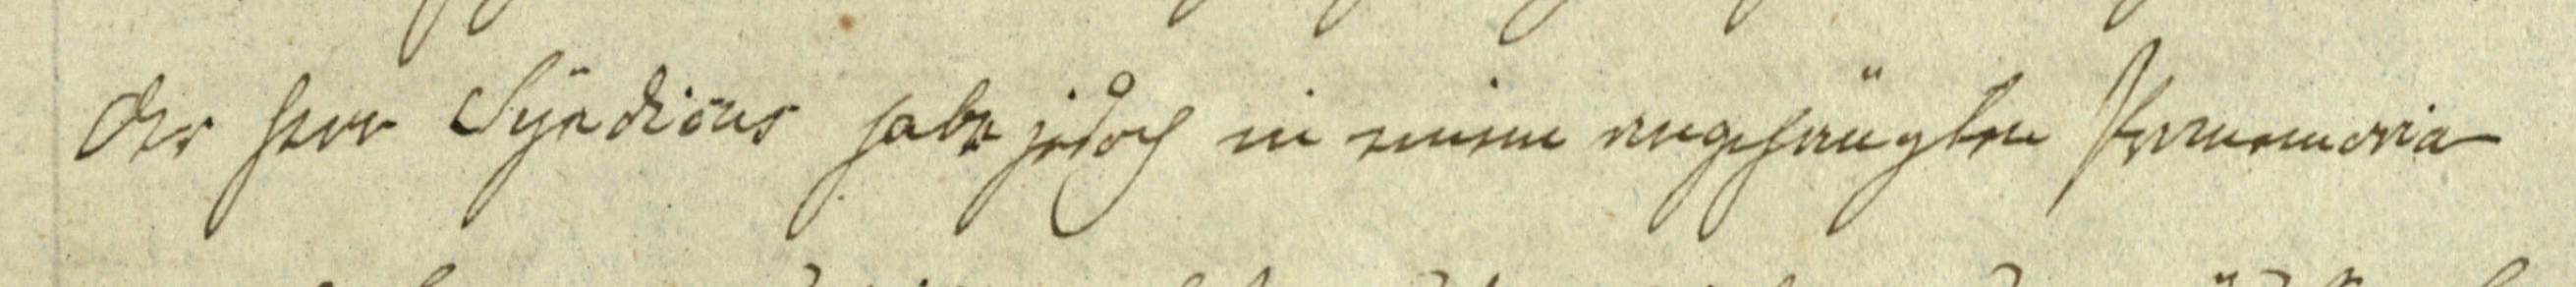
Der Herr Sÿndicus habe jedoch in einem angehängten Promemoria
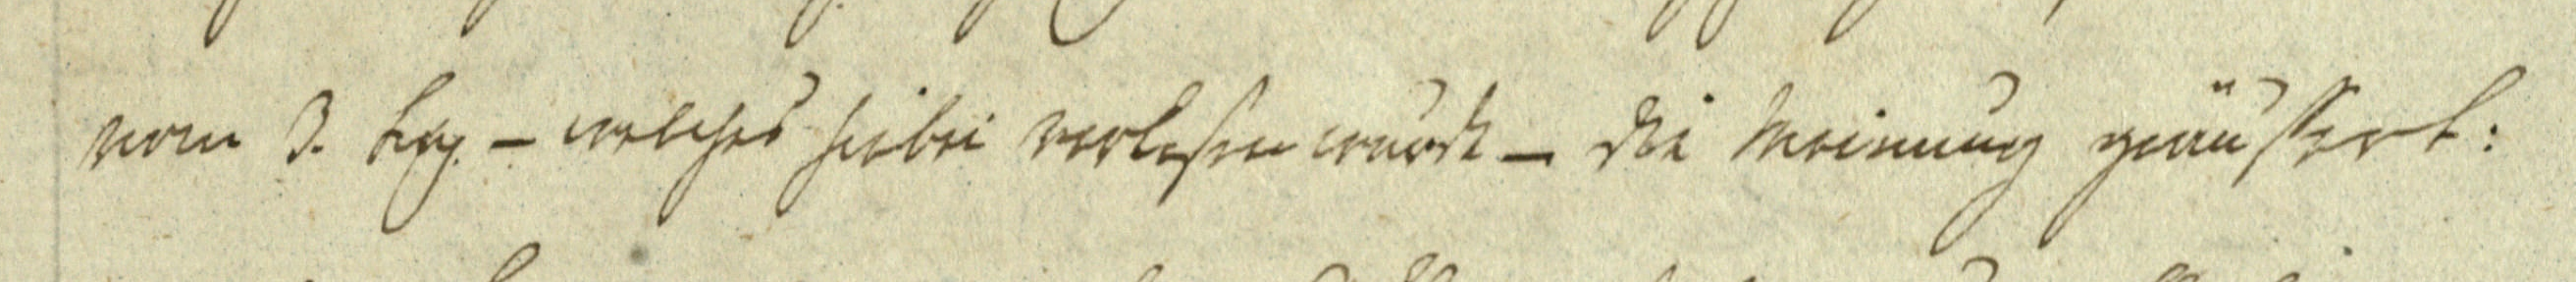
vom 3. huj. - welches hiebei verlesen wurde - die Meinung geäussert:
